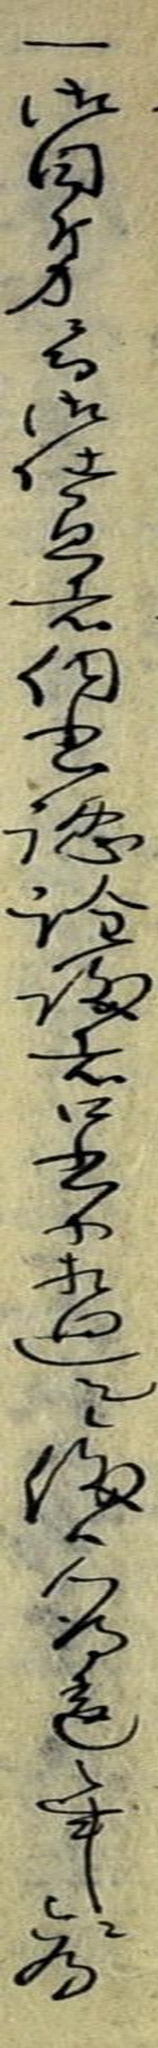一御目付方ニ而御仕置者伺書認詮議者口書等相廻シ候儀ハ心得違之事ニ被為
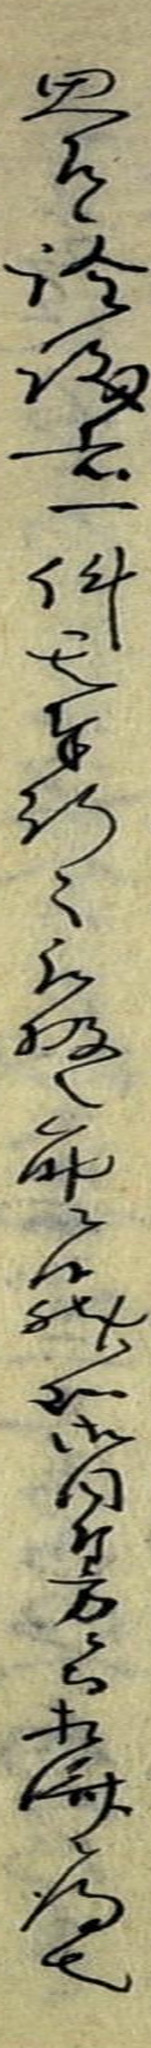思召候詮議者一件其奉行々々取扱之筋ニ候然ル処御目付方ニ而相済候得者
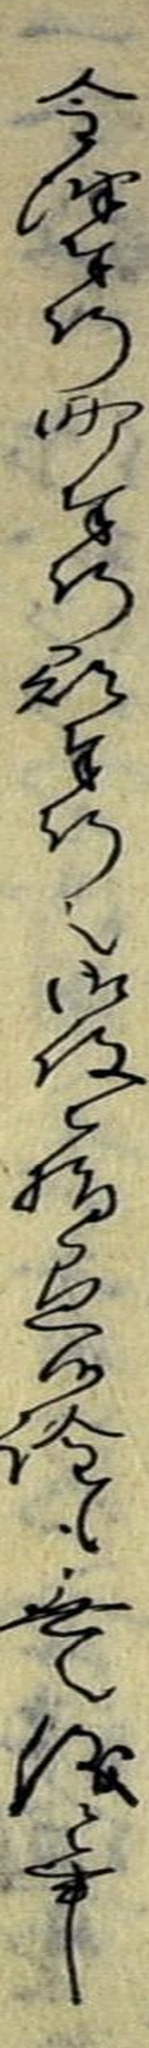金津奉行町奉行郡奉行之御役被指置候詮も無之儀ニ候事
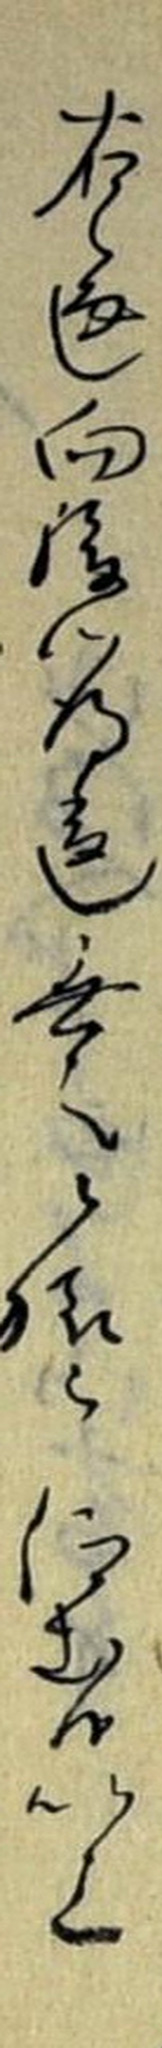右之通向後心得違無之候様被仰出候以上
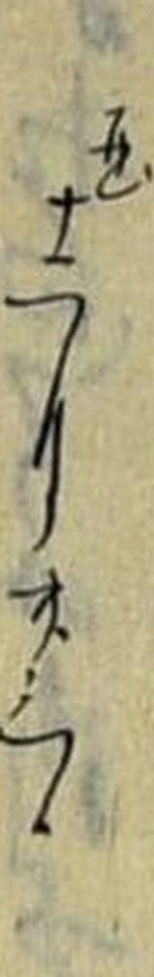酉十二月廿三日
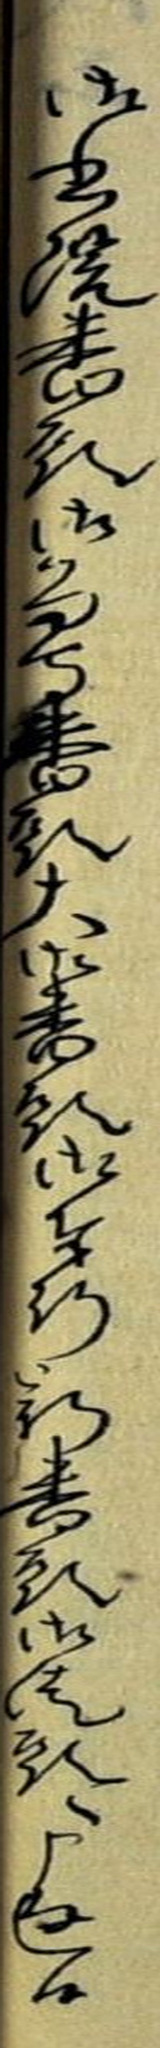御書院番頭御留守番頭大御番頭御奉行新番頭御徒頭へ申通候
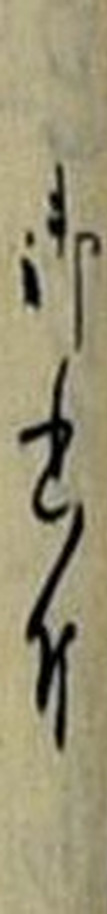御書付
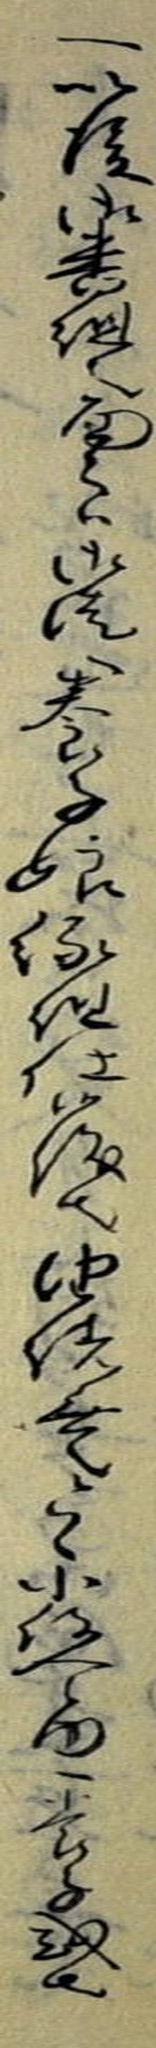一以後御番組之面々ハ御徒へ養子娘縁組仕候儀者由緒無之候ハヽ小役人之内へ養子或者
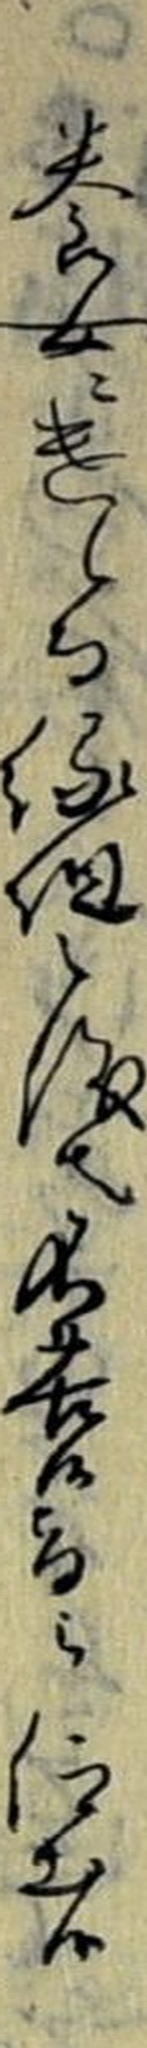養女ニ遣候而縁組之儀者不苦候旨被仰出候
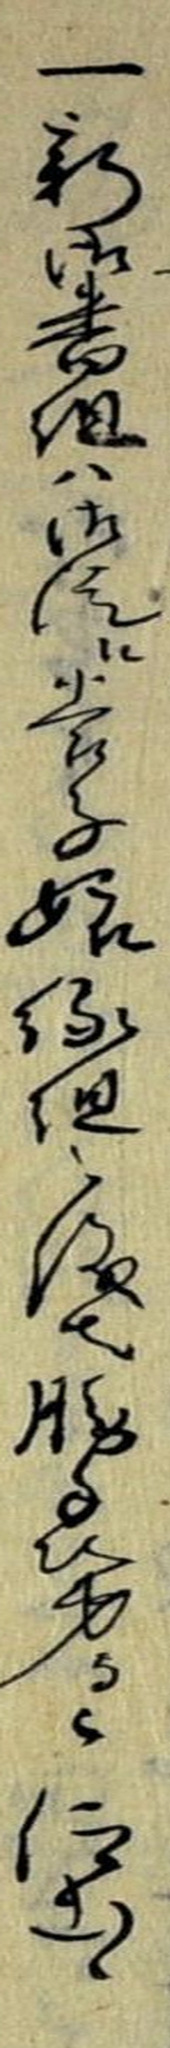一新御番組ハ御徒江養子娘縁組之儀者勝手次第与被仰出候
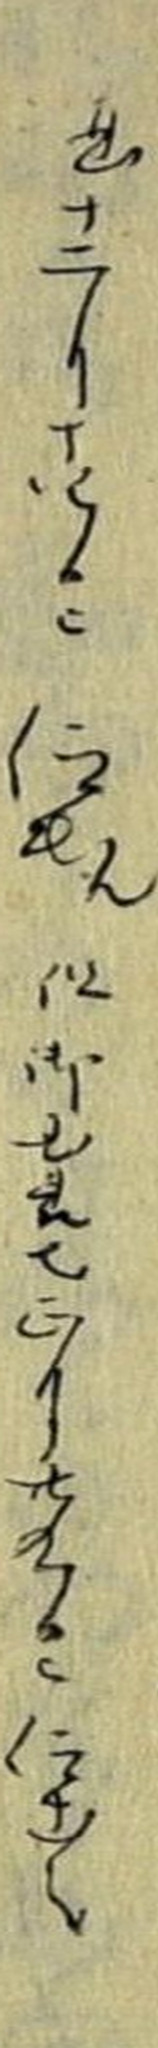酉十二月十四日被仰出候但御国表者正月廿九日被仰出之
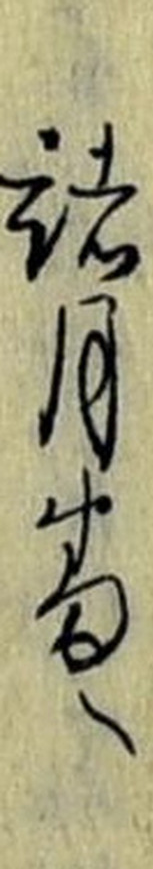諸月番へ
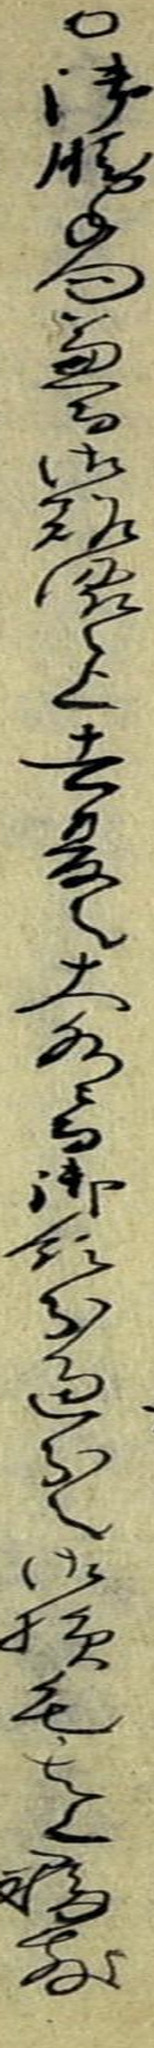〇御勝手向兼而御難渋之上去夏之大水ニ而御領分過分之御損毛其上夥敷
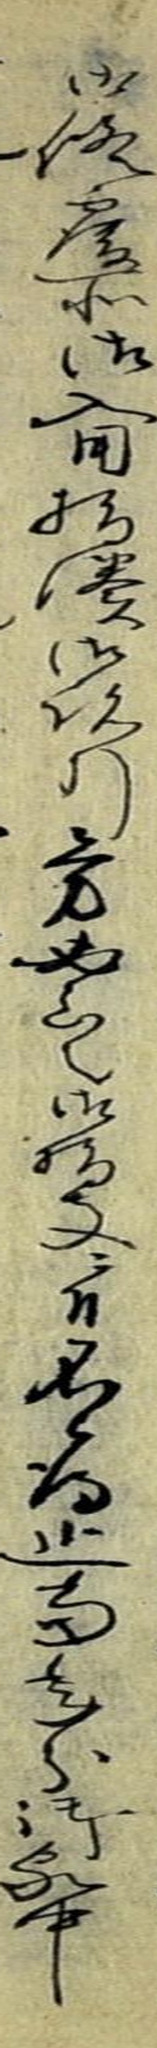御修覆所御入用指湊御跡引旁必至之御指支ニ付不被得止当年分御家中
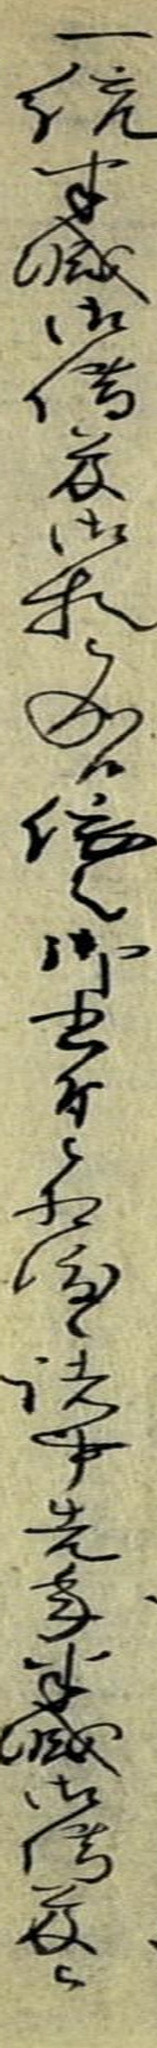一統半減御借米御頼被成候依之御書付被相渡候諸事先年半減御借米被
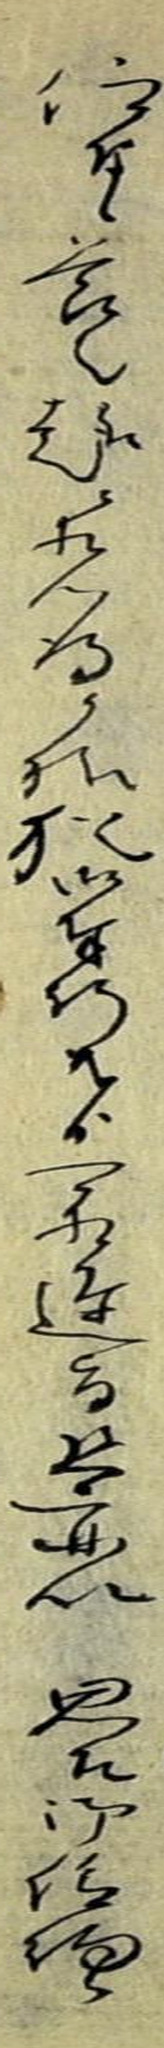仰付候節之趣ニ相心得候様猶御奉行共ゟ可相達旨且亦以思召御倹約被
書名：命令之部 三
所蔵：福井県文書館 Fukui Prefectural Archives
